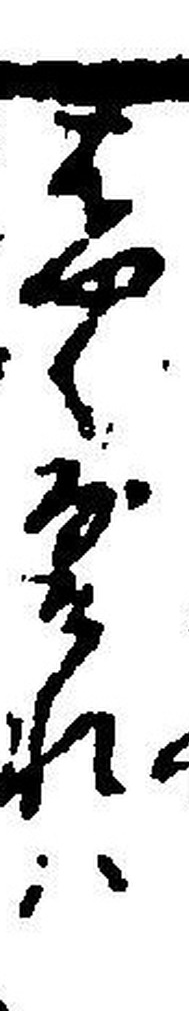はやくなけれは
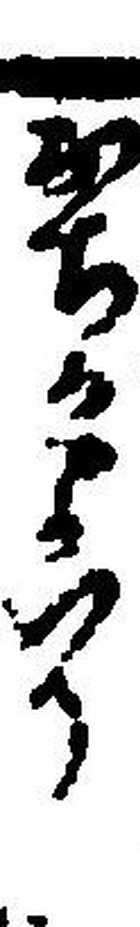おちがまいり
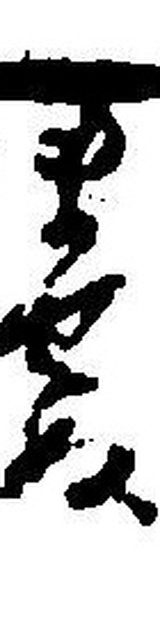ませぬ
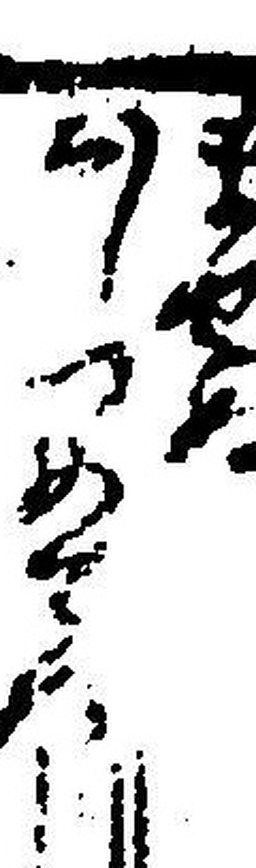おしつめては
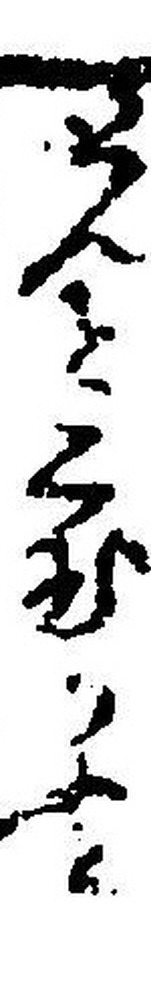とんとこむかふと
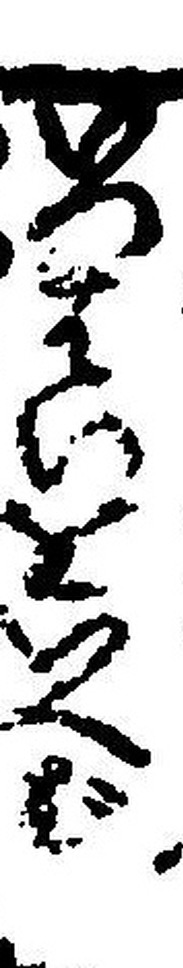いつはいをいへば
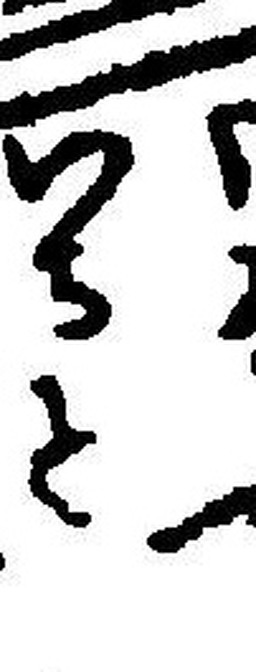てると
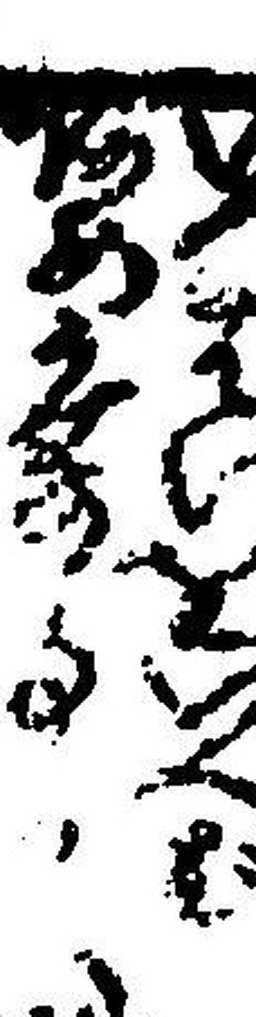あめかせの事
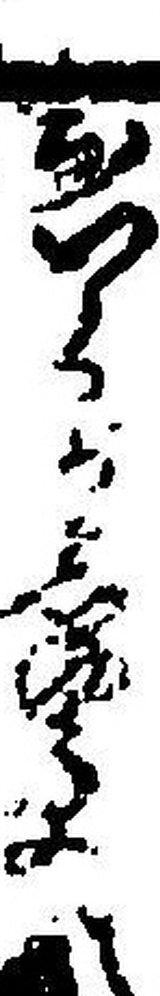おいらかしゆうに
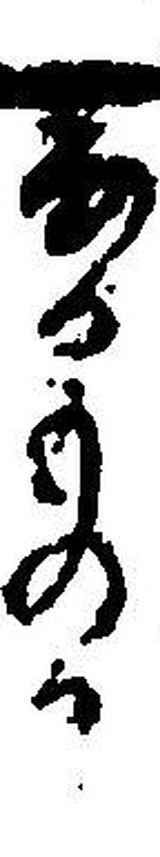なるものか
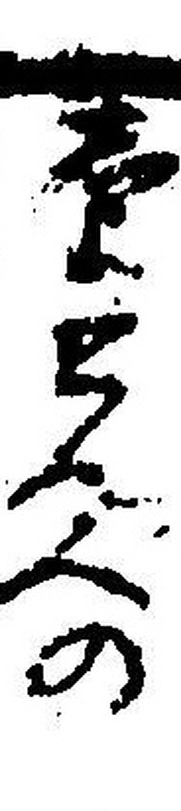しよせん人の
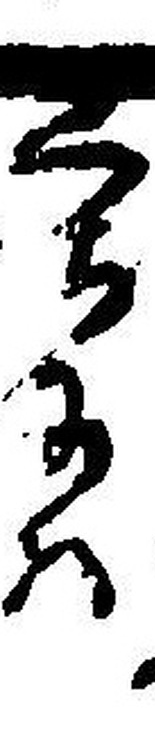くちには
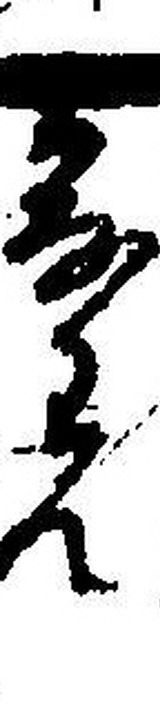かなわん
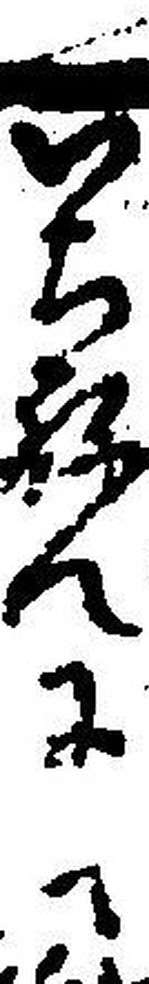いちねんに
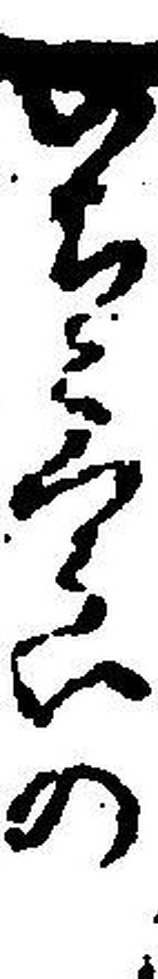いちとくらいの
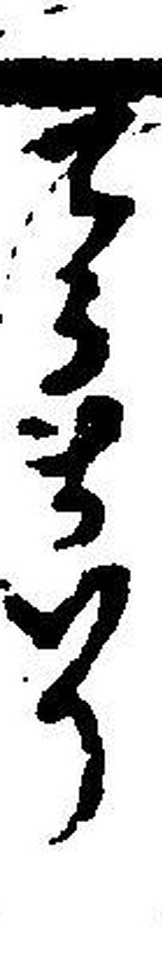てらまいり
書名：牡丹餅棚有 / 市場通笑作
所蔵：東京大学総合図書館 General Library in the University of Tokyo, JAPAN
